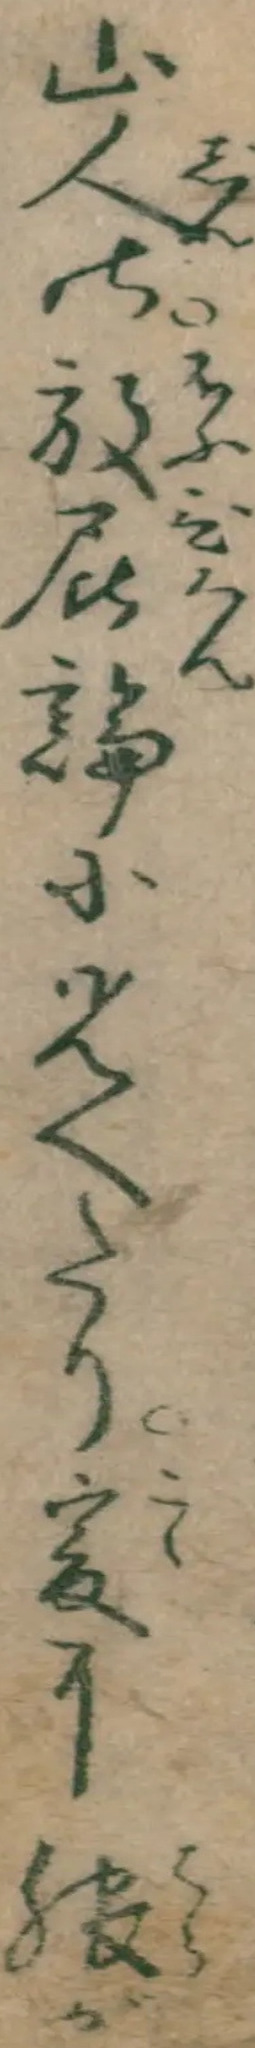山人の。放屁論に見へたり。爰に腹が
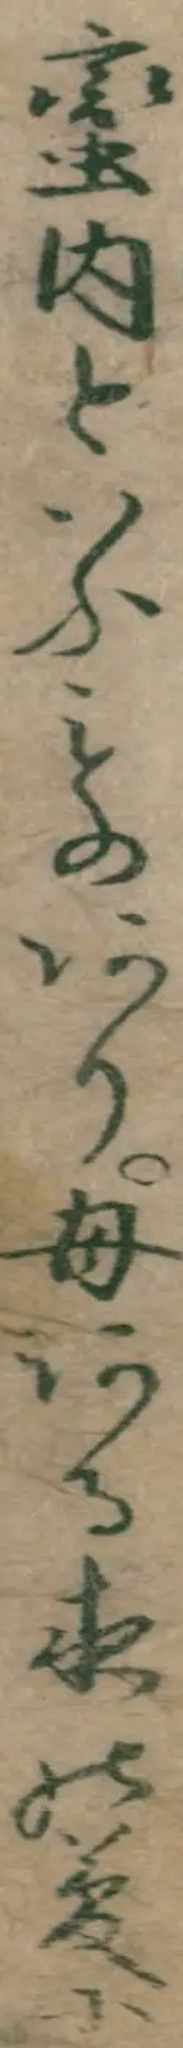蛮内といふものあり。母ある夜の夢に

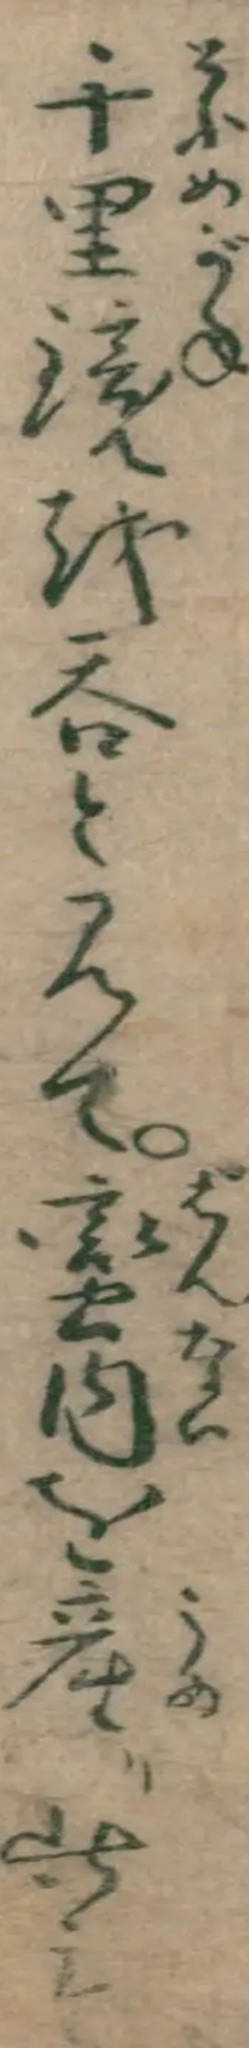千里鏡を呑と見て。蛮内を産り此もの
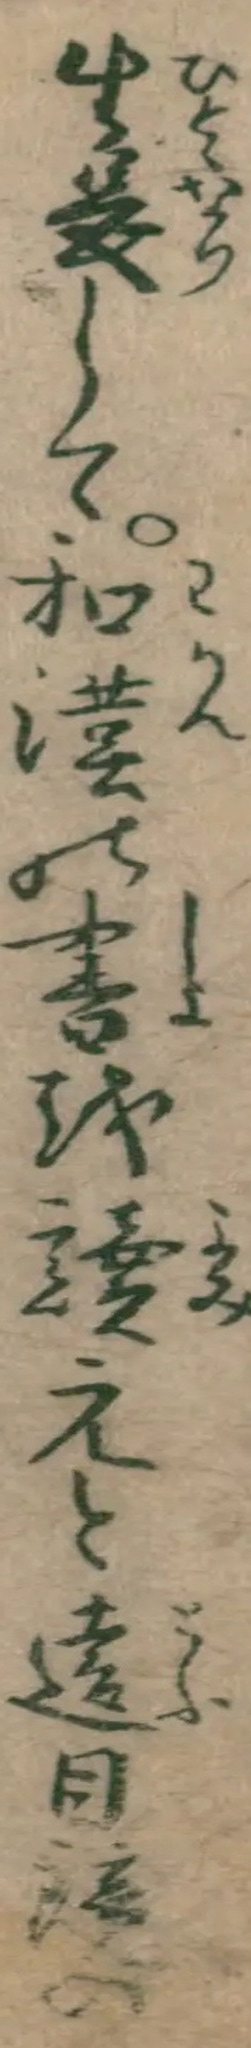生長して。和漢の書を読元と遠目鏡の
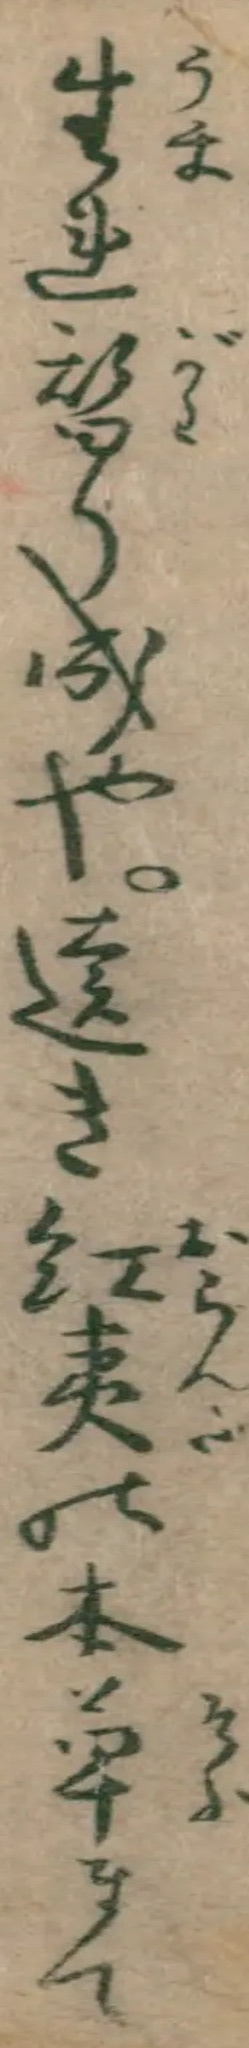生れ替り成や。遠き紅夷の本草まて
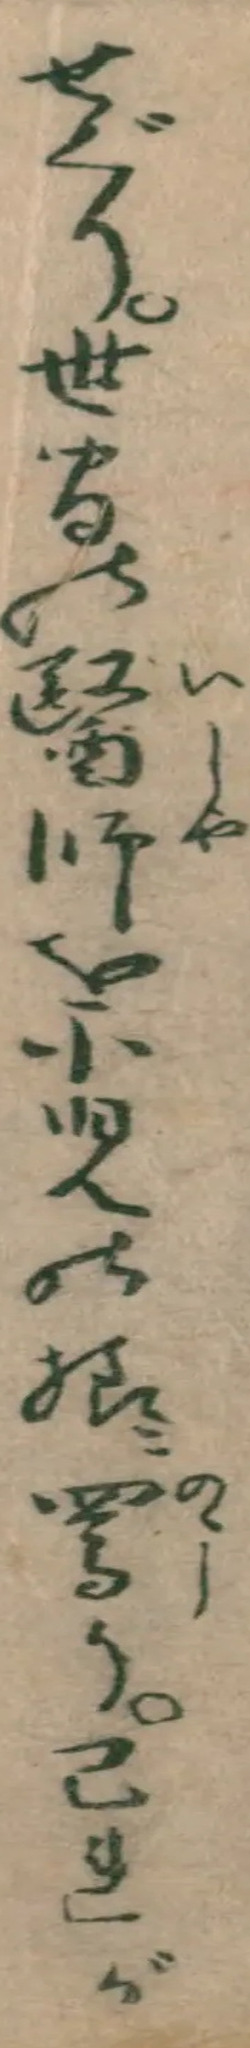せぐり。世間の医師を小児の様に罵り。己れが
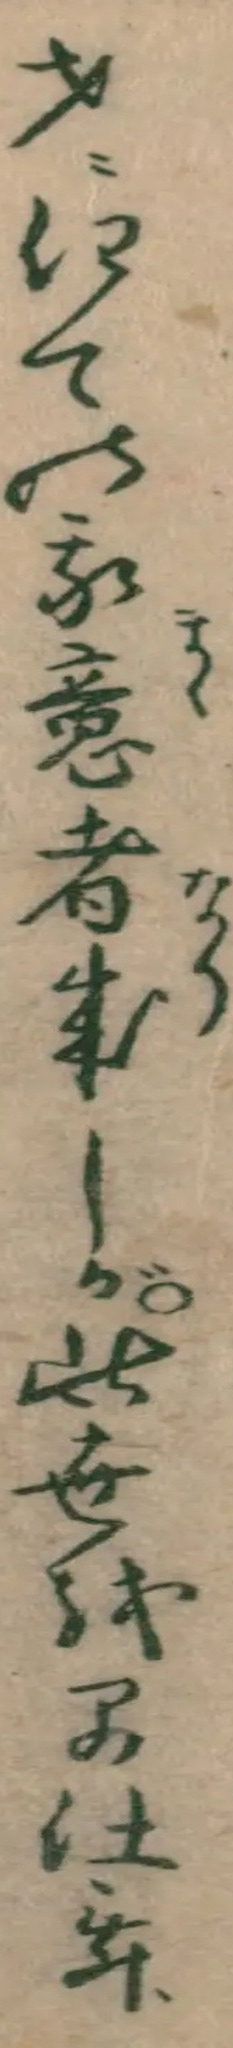才に任ての我意者成しが。此世を早仕舞
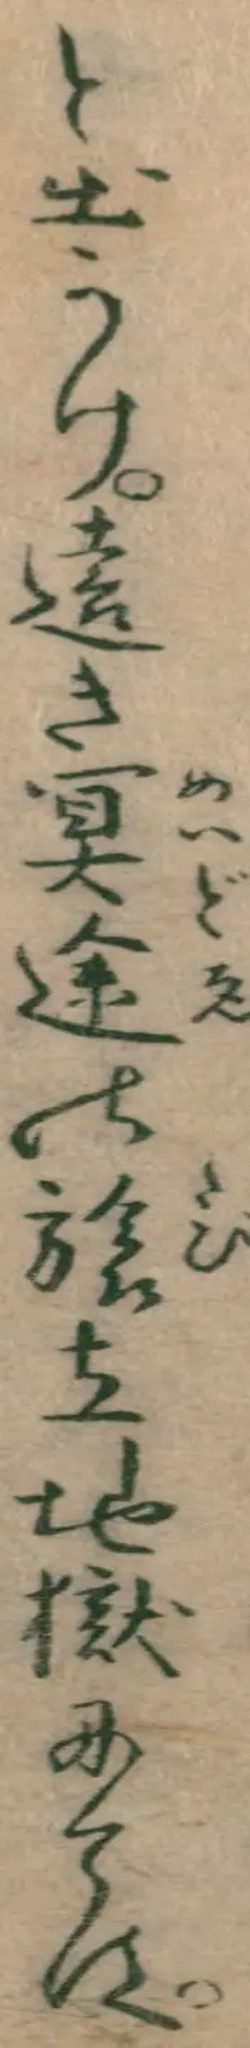と出かけ。遠き冥途の旅立し地獄にては。
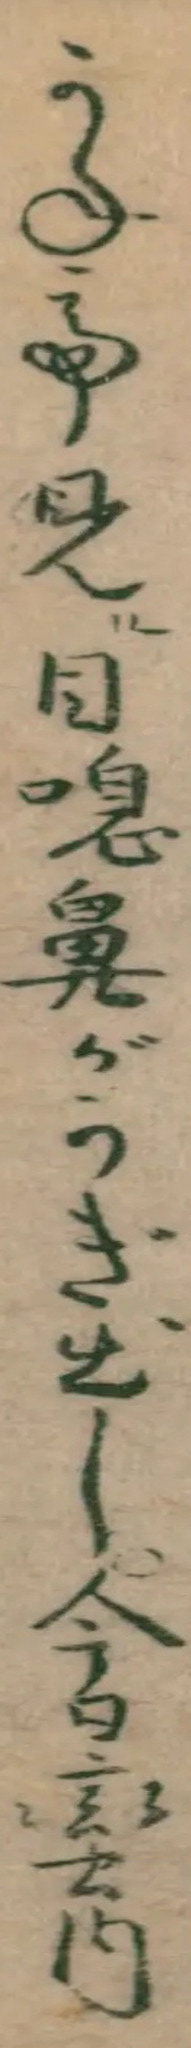かねて見る目嗅鼻がかぎ出し。今日蛮内
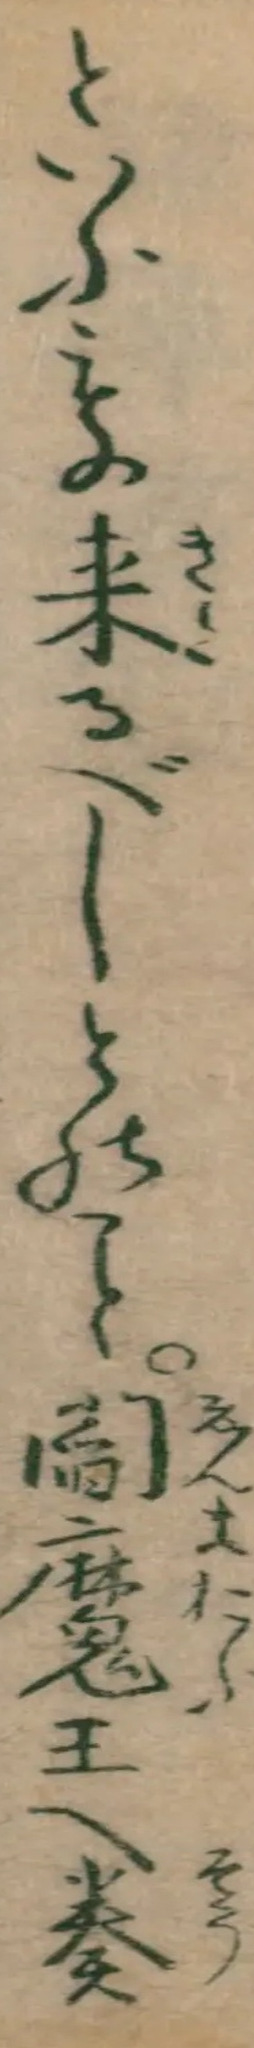といふもの来るべしとのこと。閻魔王へ奏
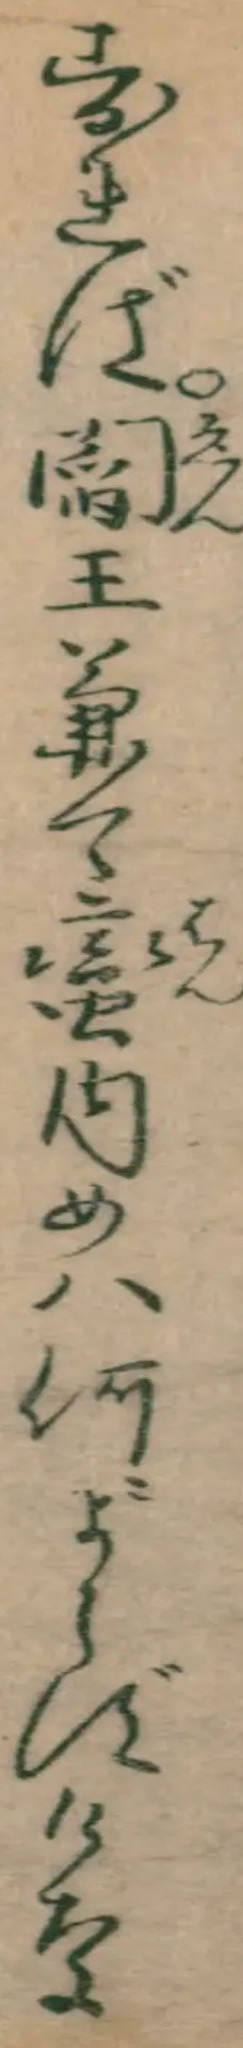すれば。閻王兼て蛮内めは何によらずけな
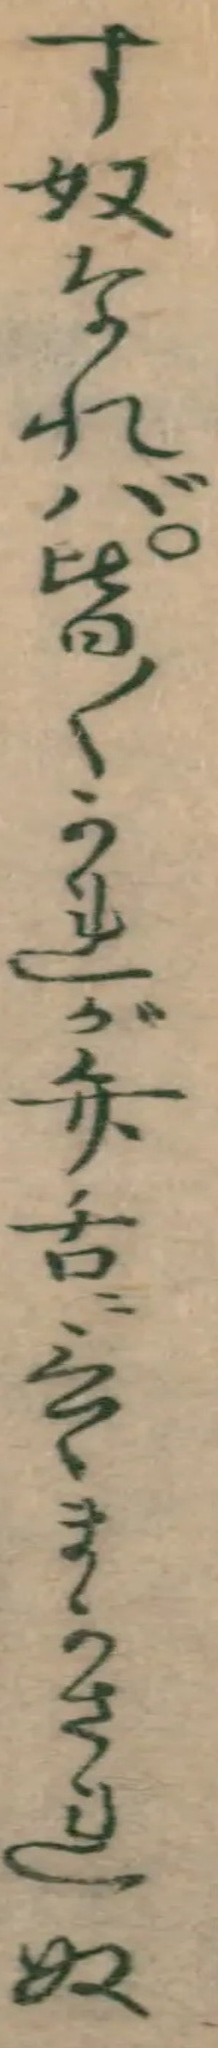す奴なれば。皆々かれが弁舌に言ゝまかされぬ
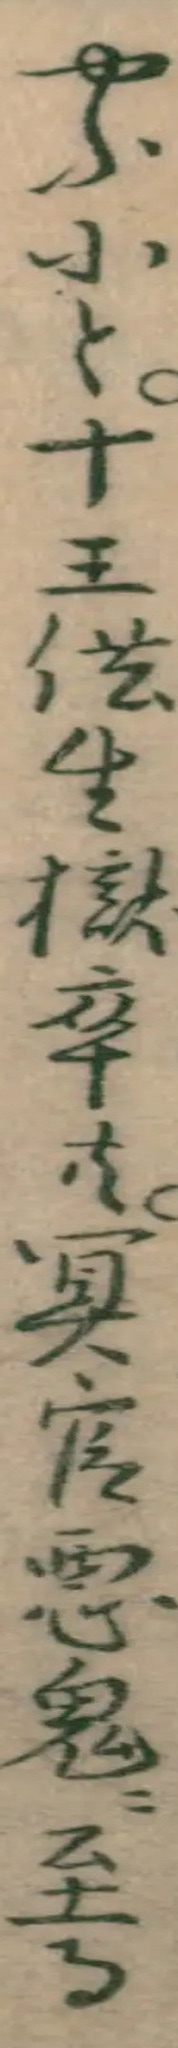やふにと。十王供生獄卒共。冥官悪鬼に至る
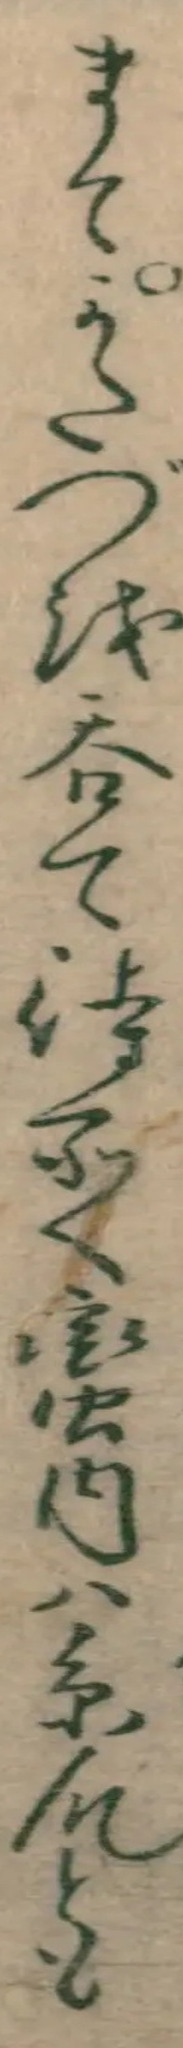まて。かたづを呑て待所へ。蛮内は糸瓜とも
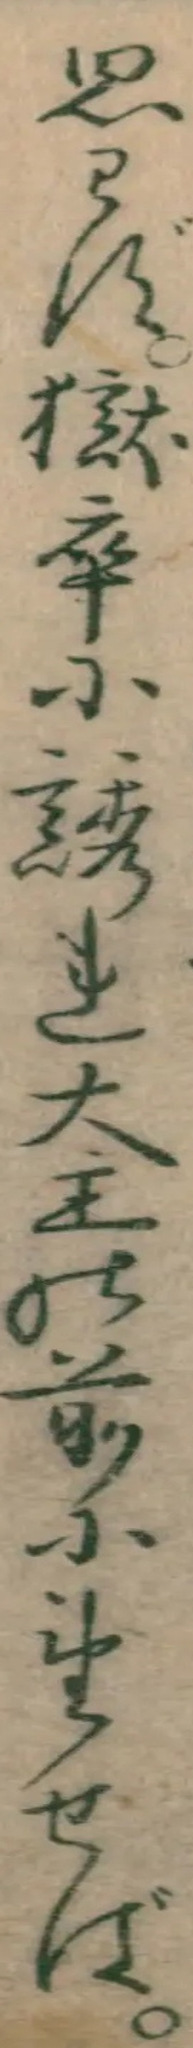思はず。獄卒に誘れ大王の前に坐せば。
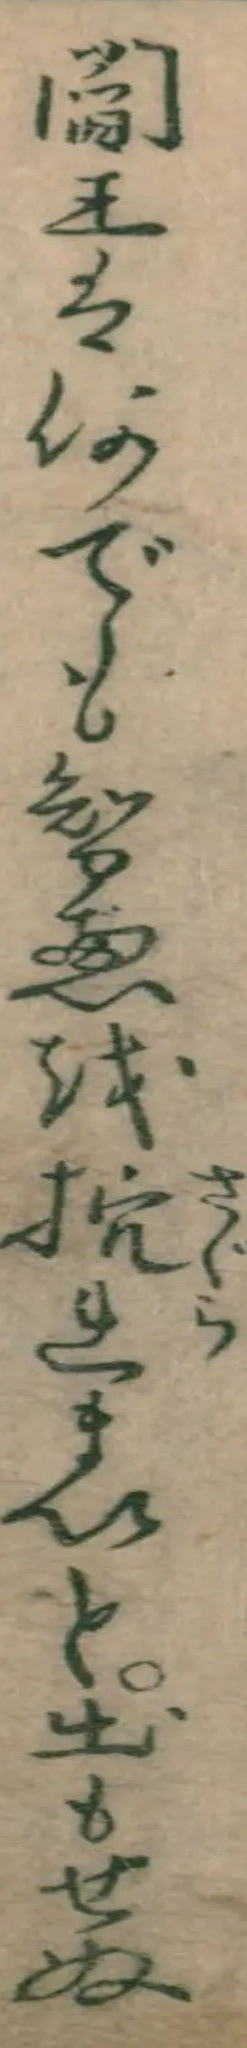閻王は何でも知恵を抭れまいと。出もせぬ
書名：翻草盲目
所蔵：国立国会図書館 National Diet Library, JAPAN
